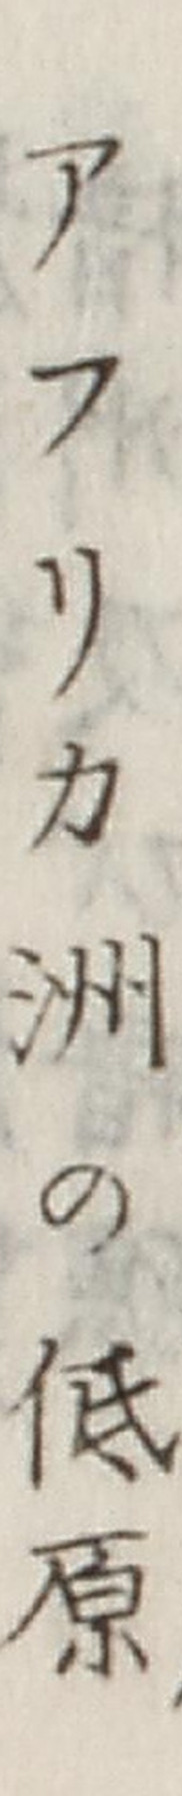アフリカ洲の低原
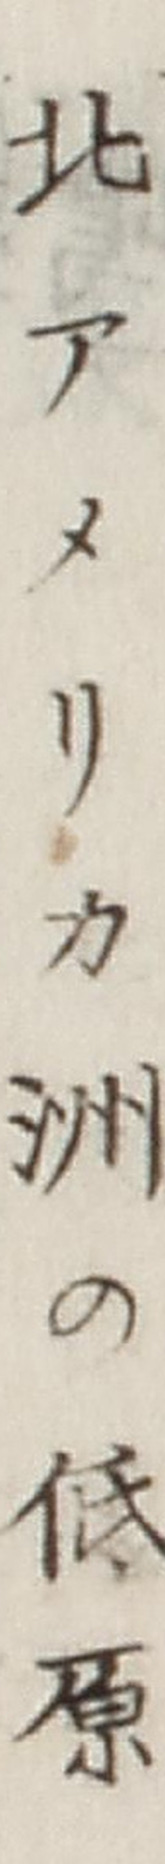北アメリカ洲の低原
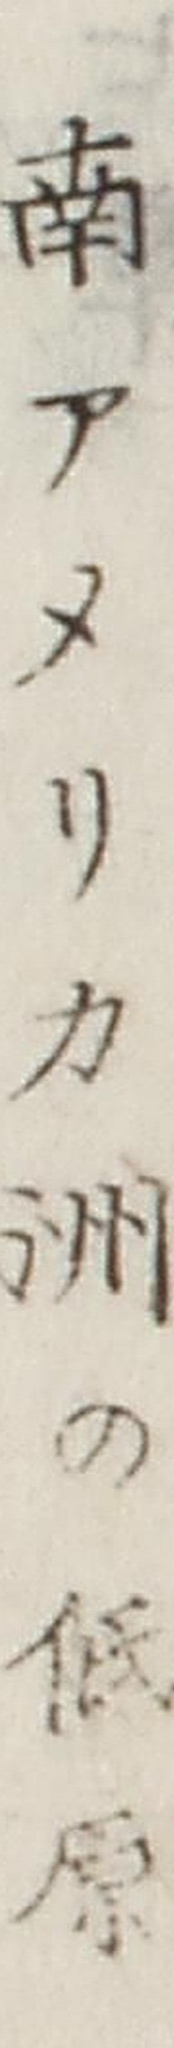南アメリカ洲の低原
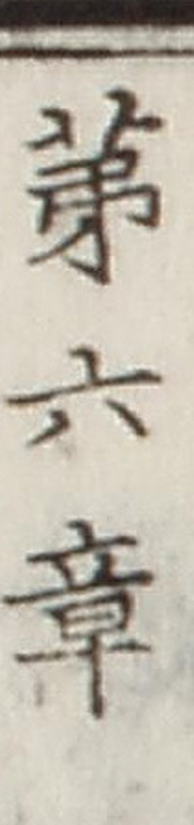第六章
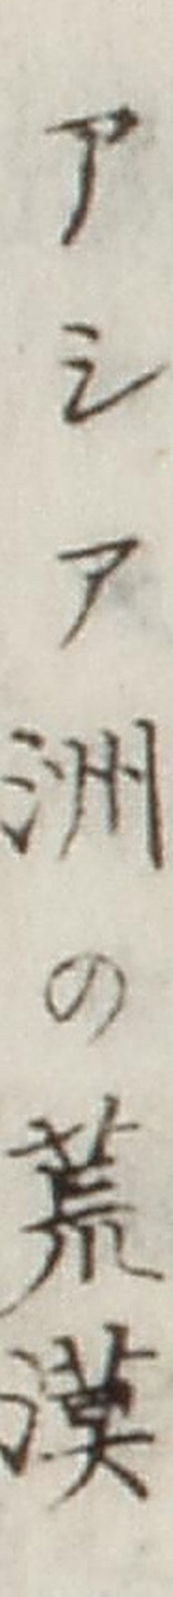アシア洲の荒漠
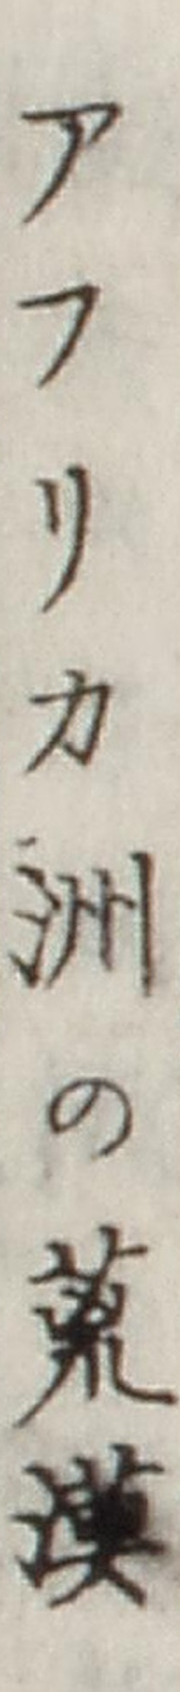アフリカ洲の荒漠

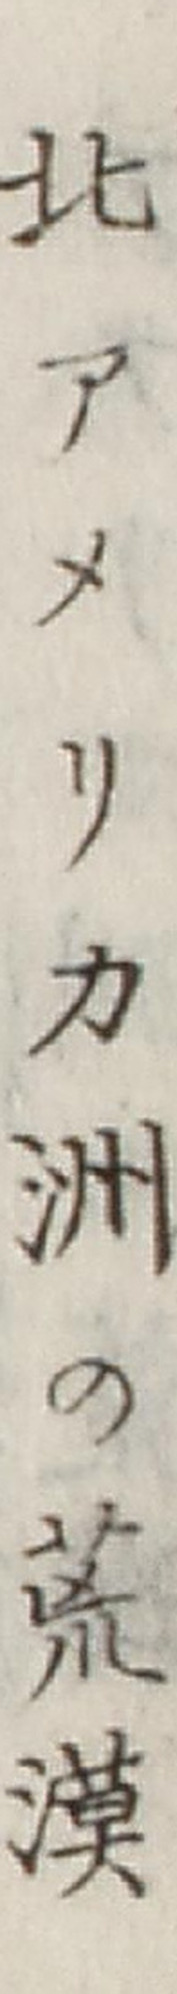北アメリカ洲の荒漠
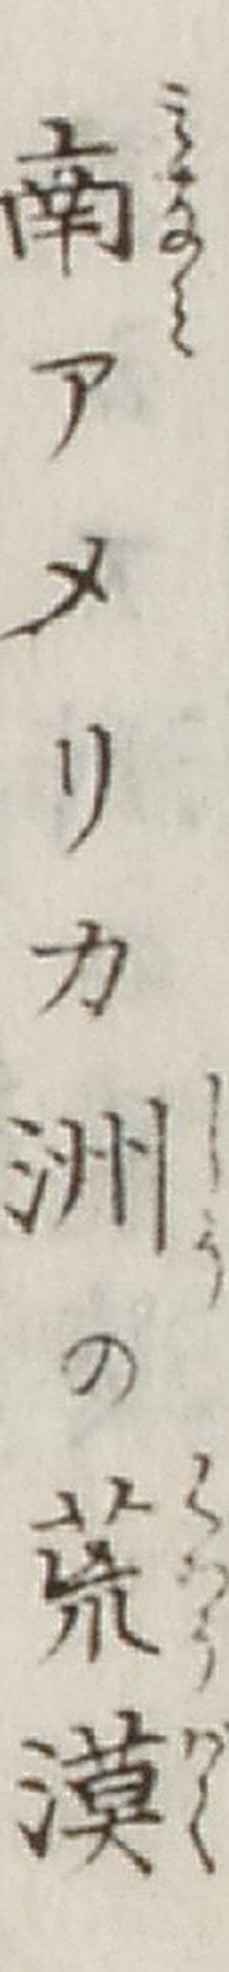南アメリカ洲の荒漠
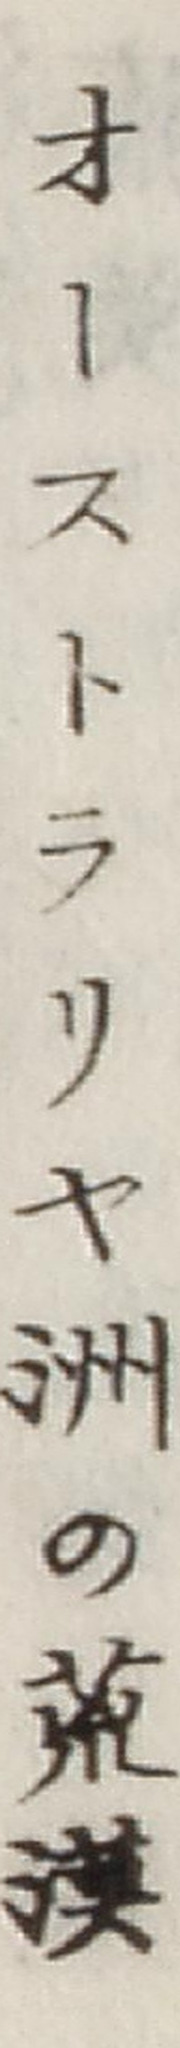オーストラリヤ洲の荒漠
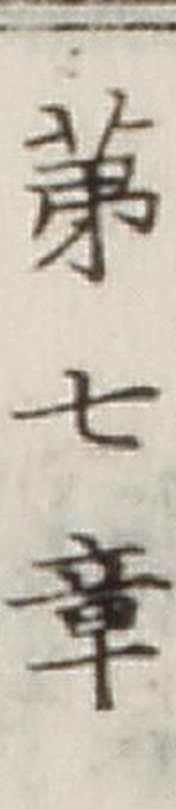第七章
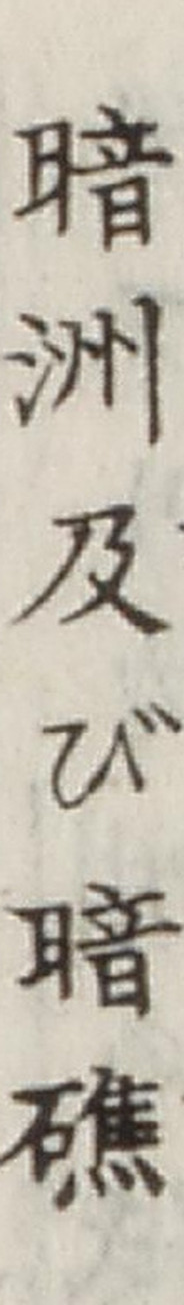暗州及び暗礁
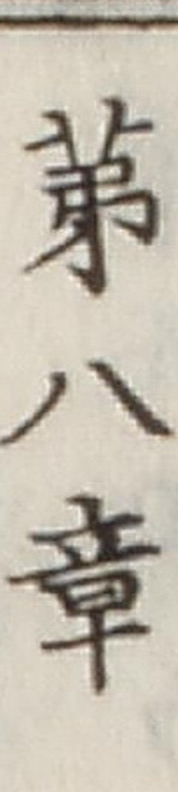第八章
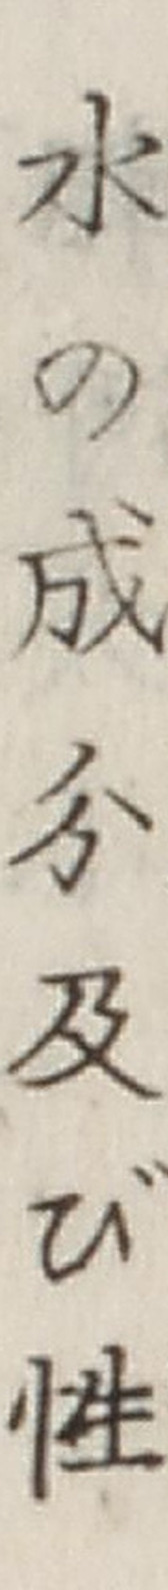水の成分及び性
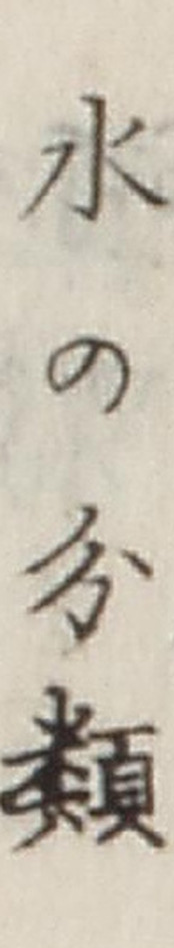水の分類
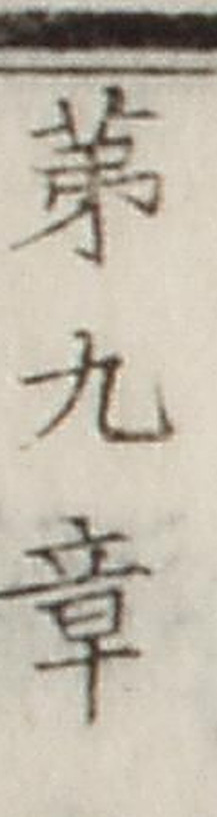第九章

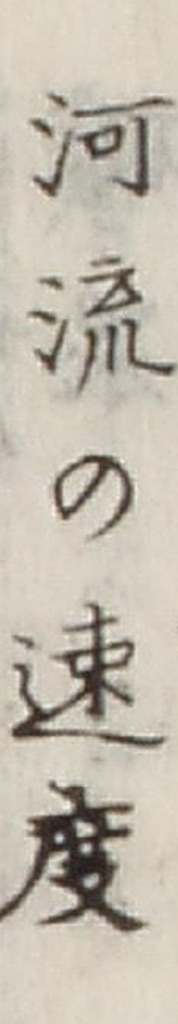河流の速度
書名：訓蒙　天然地理學　上
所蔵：東京大学地震研究所図書室 Earthquake Research Institute Library, The University of Tokyo, JAPAN
